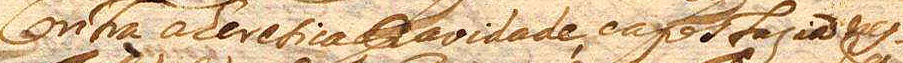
Contra a heretica pravidade, e apostasia nes
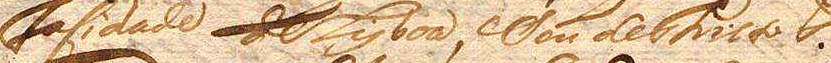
ta Cidade de Lisboa, e Seu destricto &.a
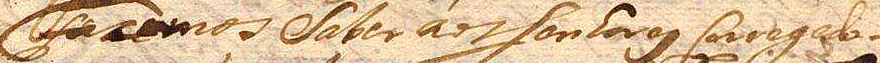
Fazemos Saber aos senhores Corregedo
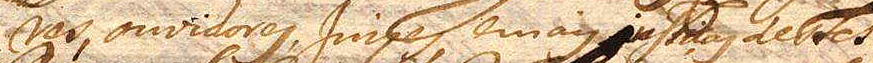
res, ouvidores, Juizes, e mais justiças destes
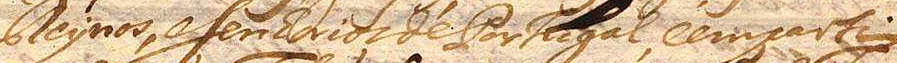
Reynos, e senhorios de Portugal, e em parti
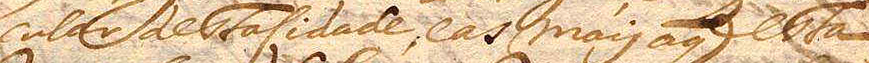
cular desta Cidade, e as mais a q̄ esta
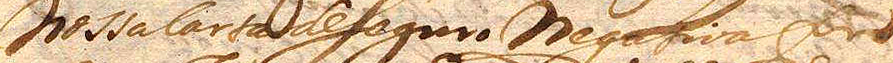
Nossa Carta de seguro Negativa for
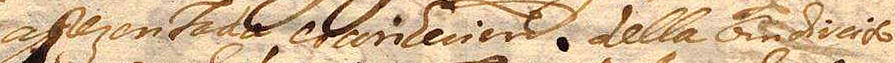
aprezentada, e o conhecimto. della com direito
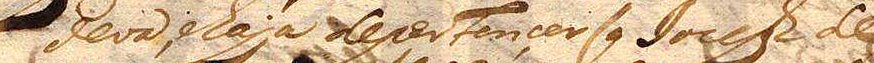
deva, e haja de pertencer q̄ Iozeph de
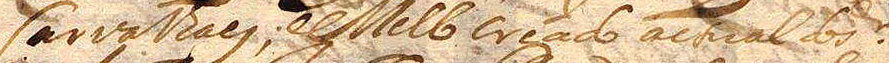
Carvalhaes; e Mello creado actual do sor.
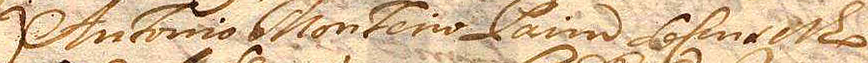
Antonio Monteiro Paim do Conselho
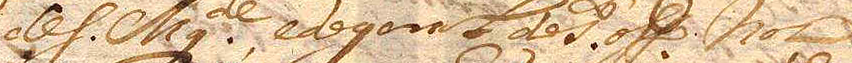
de s. Mg.de, e do geraL do s.to off.o Nos
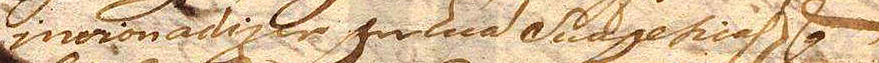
inviou a dizer por huā sua petiçaõ q̄
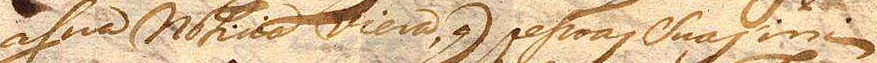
a sua noticia viera, q̄ pessoas suas ini
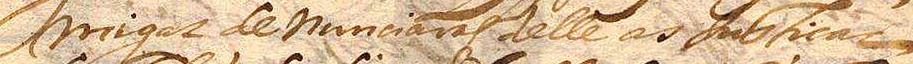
migas denunciaraõ delle as Iustiças
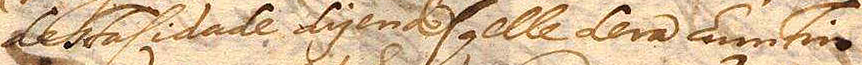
desta Cidade dizendo q̄ elle dera hum tiro
